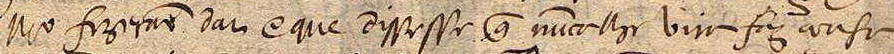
lho fizerão dar e que dissesse q̄ nūca lhe vira faz̄ cousa
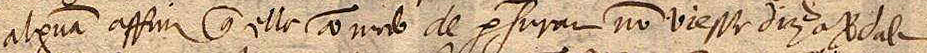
algūa a ffim q̄ ella c̄o medo de ꝑJurar n̄o viesse diz̄ a ꝟdade
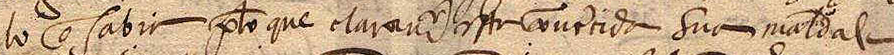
do q̄ sabia p̄lo que claramte esta c̄ouēcida sua maldade
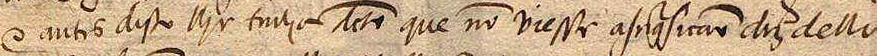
e antes disto lhe tinha d̄cto que nō viesse a Jnqisicão diz̄ della
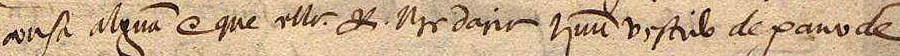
cousa algūa e que ella .R. lhe daria hūu vestido de pano de
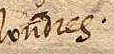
londres.
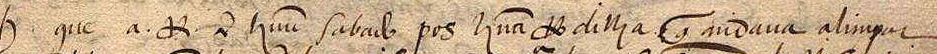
Pra que a .R. ē hūu sabado pos hūa Rodilha q̄ andaua a limpar
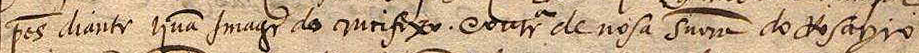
p̄os diante hūa Jmagē do crucifixo. e outra de nosa S̄nora do Rosayro
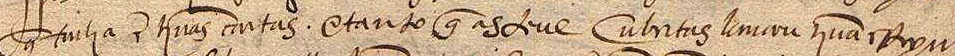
q̄ tinha ē hūas cartas . e tanto q̄ as teue Cubertas lancou h̄ua esteyra
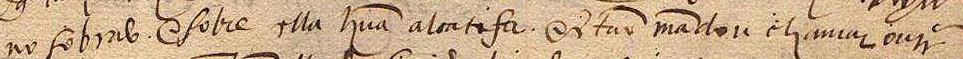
no sobrado. e sobre ella hūa alcatifa. e ētão m̄adou chamar outra
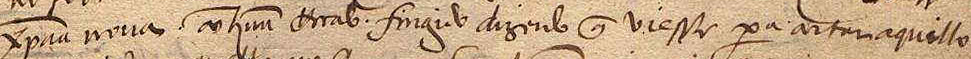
Xpāa noua c̄o hūu Recado. fingindo dizendo q̄ viesse ꝑa cortar aquillo
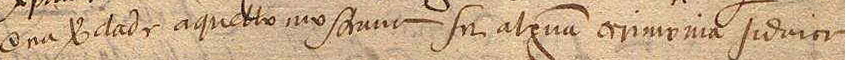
e na ꝟdade aquello mostraua ser algūa cerimonia Judaica
